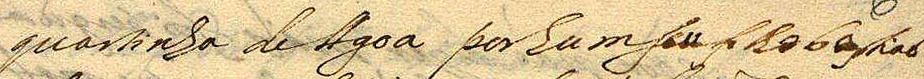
quartinha de Agoa per hum seu filho bastiaõ
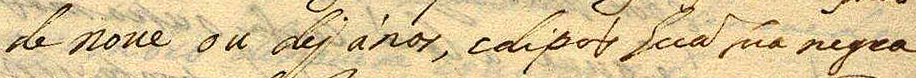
de noue ou dez an̄os, e dipois huā sua negra
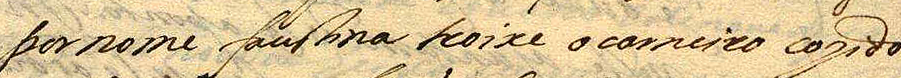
por nome faustina troixe o carneiro cozido
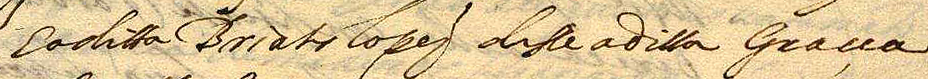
E a ditta Briatris lopez̄ disse a ditta Graçia
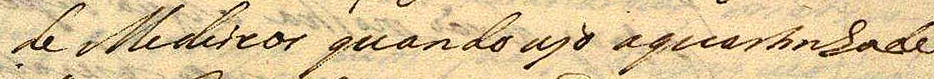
de Medeiros quando ujo a quartinha de
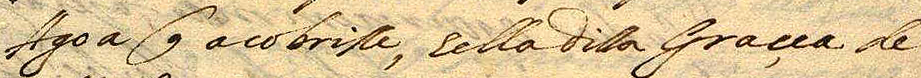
Agoa q̄ a cobrisse, E ella ditta Graçia de
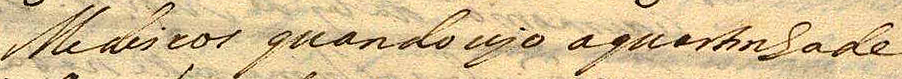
Medeiros quando ujo a quartinha de
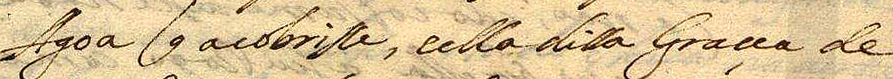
Agoa q̄ a cobrisse, e ella ditta Graçia de
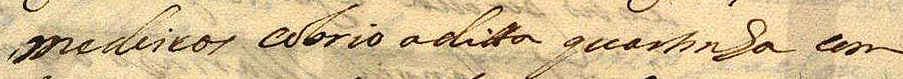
medeiros cobrio a ditta quartinha com
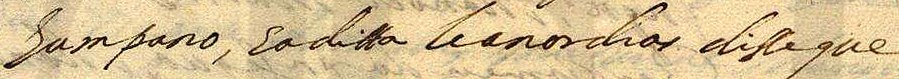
hum pano, E a ditta leanor dias disse que
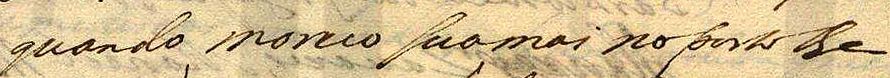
quando morreo sua mai no porto lhe
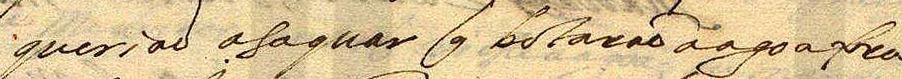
queriaõ asaquar q̄ botaraõ a agoa fora
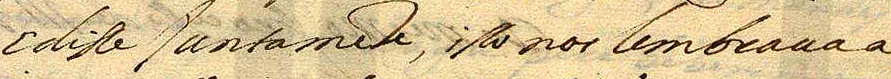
E disse Juntamēte, isso nos lembraua a
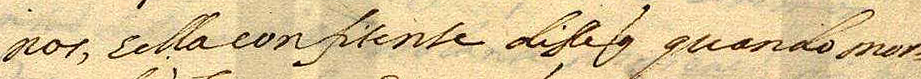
nos, E ella confitente disse q̄ quando mor
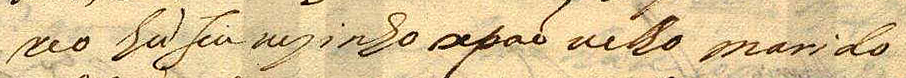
reo hū seu uezinho xpaõ uelho marido
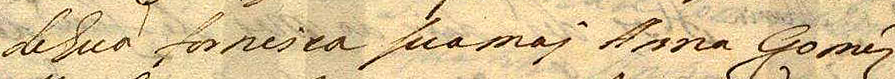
de huā forneira sua maj Anna Gomez̄
